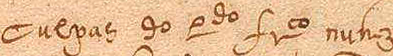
Culpas do Ldo frco nun̅ez
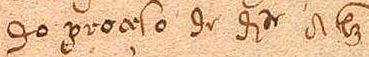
do proçeso de d̅te Al̅z
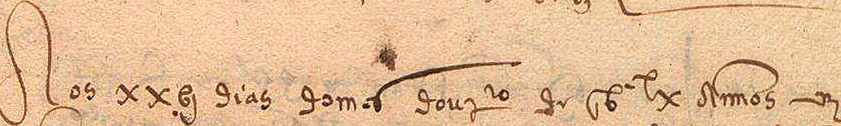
Aos xxbj dias do mes doutro de j̄bclx An̅nos em
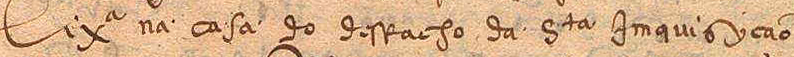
Lixa na casa do despacho da Sta Jmquisyçaõ
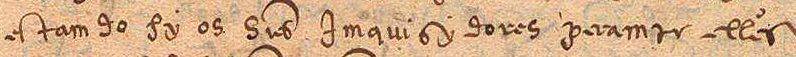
estamdo hy os Sr̅s Jmquisydores peramte elles
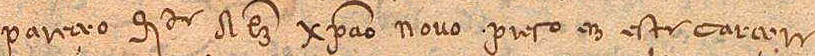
pareçeo d̅te Al̅z xp̅ao nouo preso em este carçere
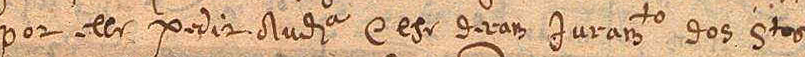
por elle pedir Aud̅a e lhe deram Juramto dos Stos
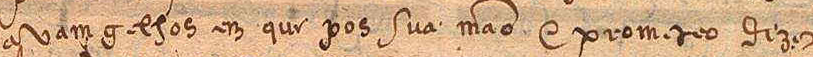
avamgelhos em que pos sua mão e prometeo dizer
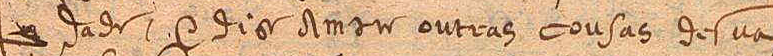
ꝟdade, e dise Amtre outras cousas de sua
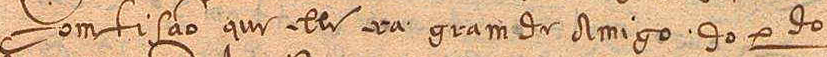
Comfisão que elle era gramde Amigo do Ldo
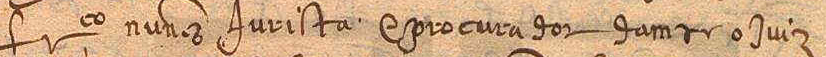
frco nun̅ez Jurista e procurador damte o Juiz
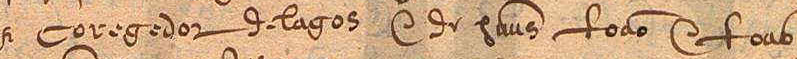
e Coregedor de lagos e de hu̅us foão e foão
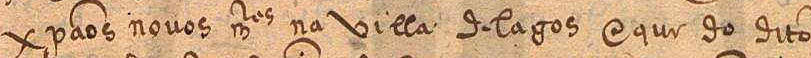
xpa̅os nouos mres na villa de lagos e que do dito
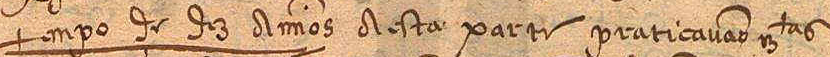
tempo de dez Ann̅os A esta parte praticauão mtas
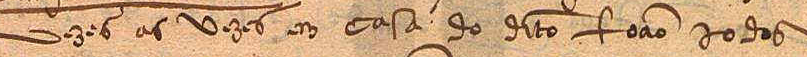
vezes as vezes em casa do dito foão todos
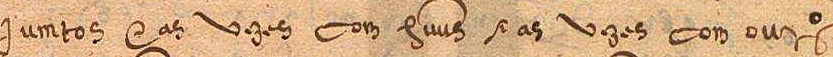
jumtos e as vezes com hu̅us e as vezes com outros
